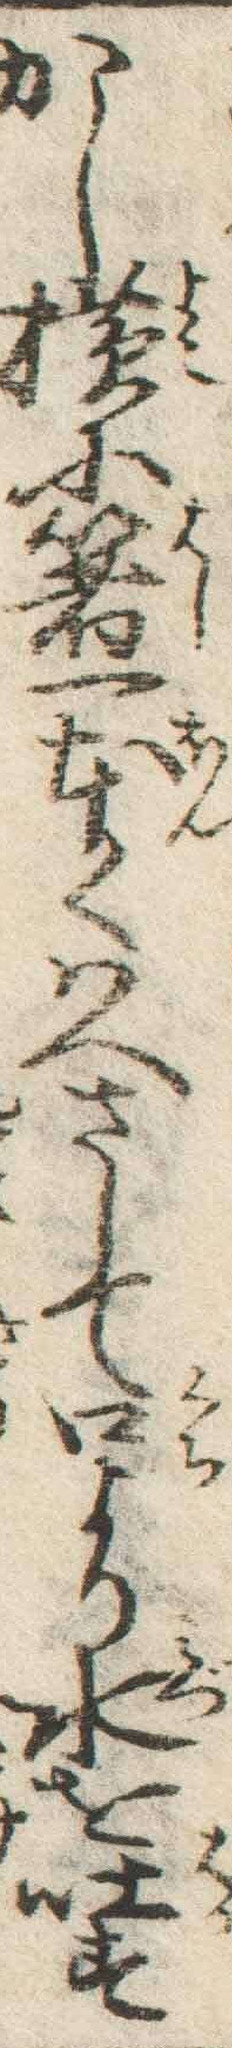かし横に箸一本くはへさして口より水を吐す
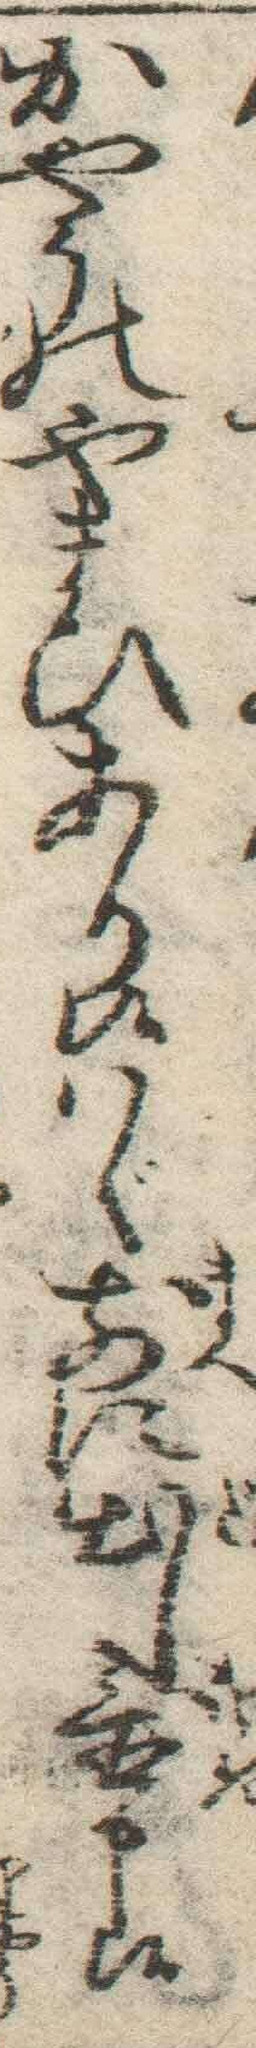かやうのやまひあり候はゞ前に出し置申候
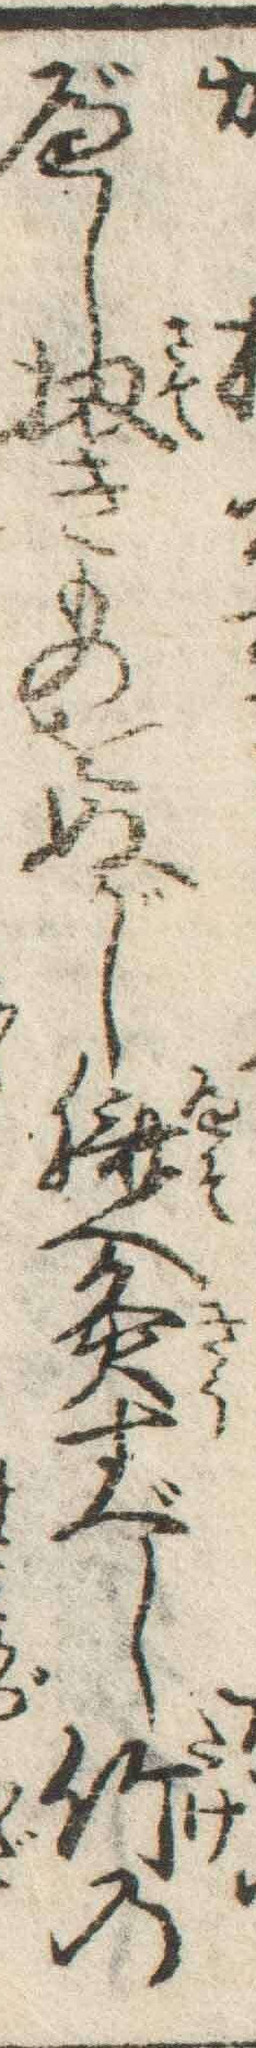べし扨きものをぬがし臍へ灸すべし竹の
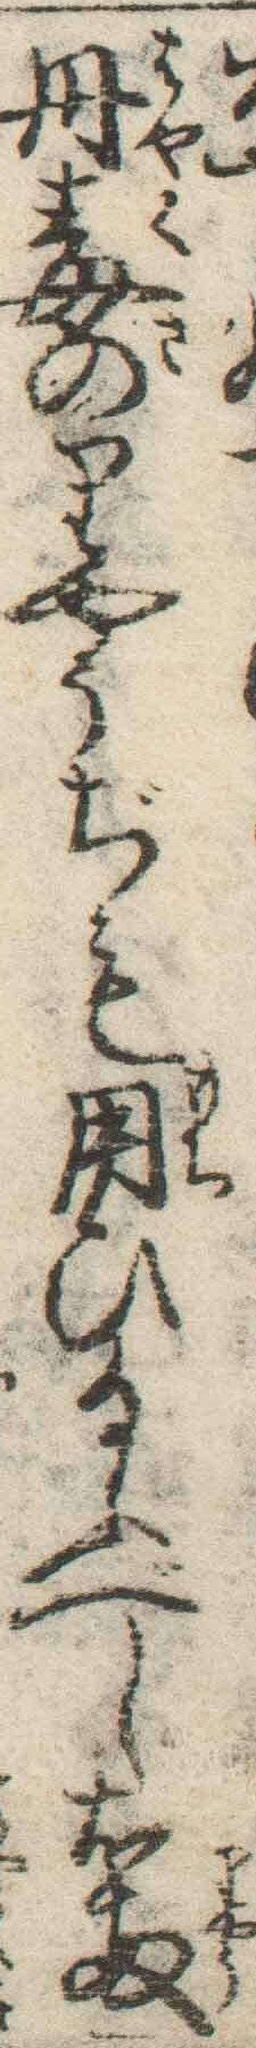丹毒のりやうぢも用ひ給ふべし右両
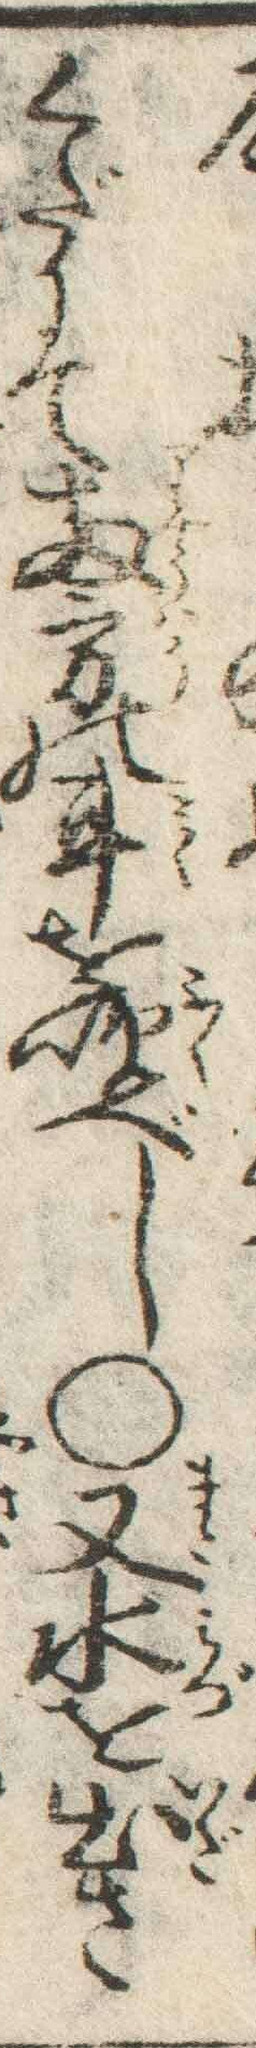くだにて両方の耳を吹べし○又水を出さ
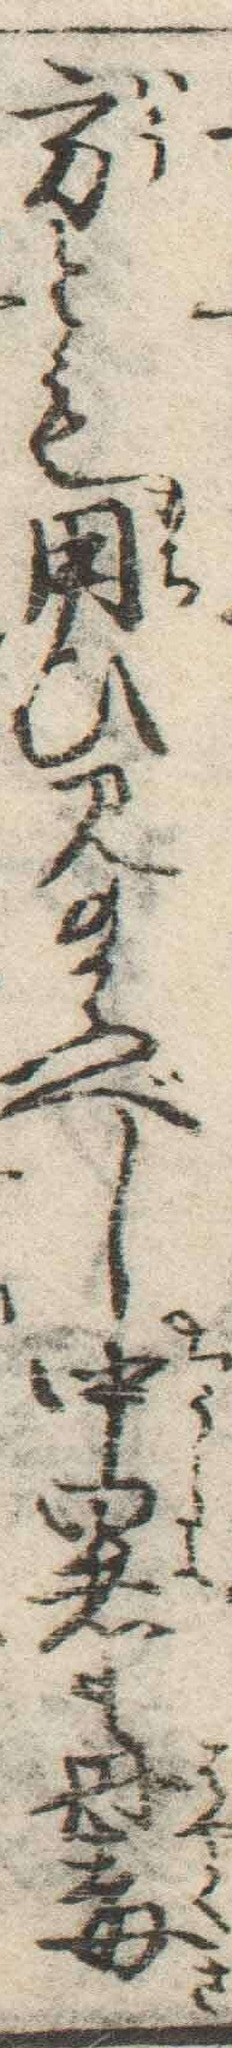方とも用ひ見給ふべし中暑も丹毒
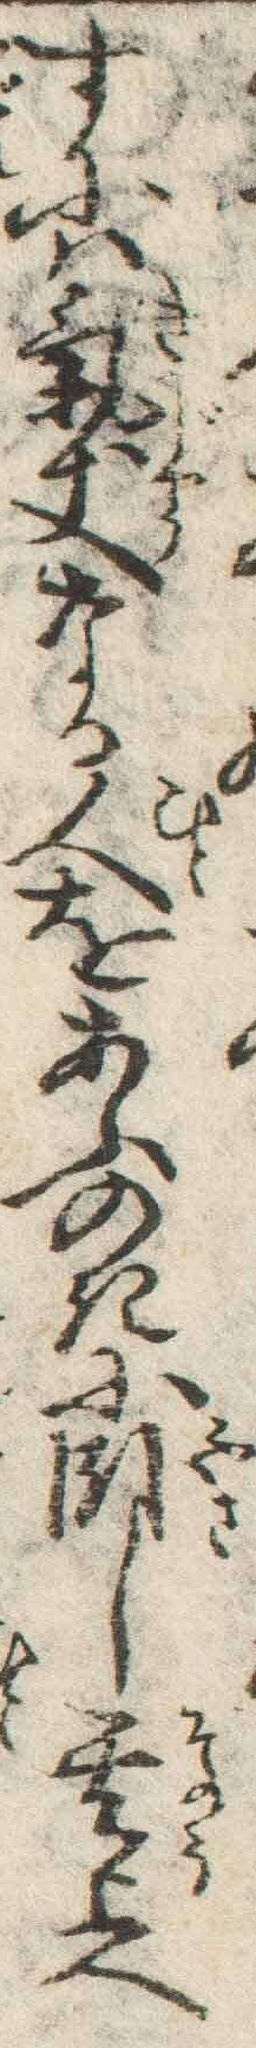すには気丈なる人をあふのきに臥し其上へ
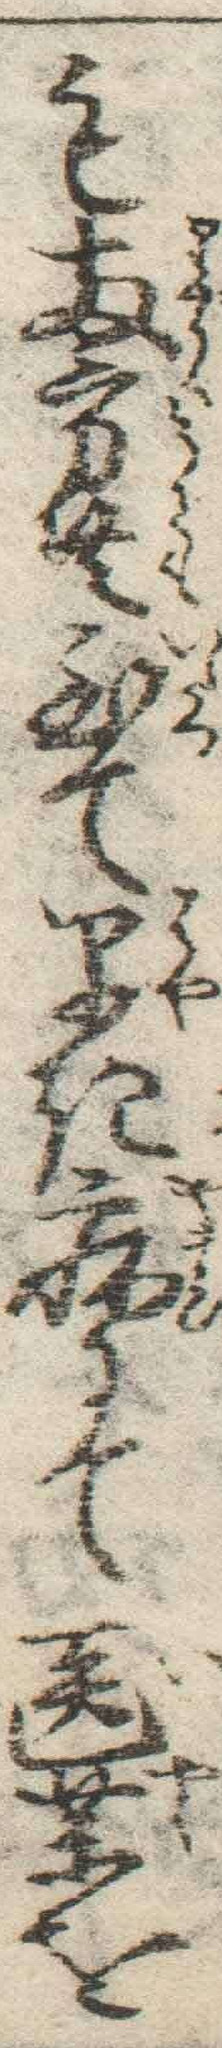も両方共至て早き病にて医薬を
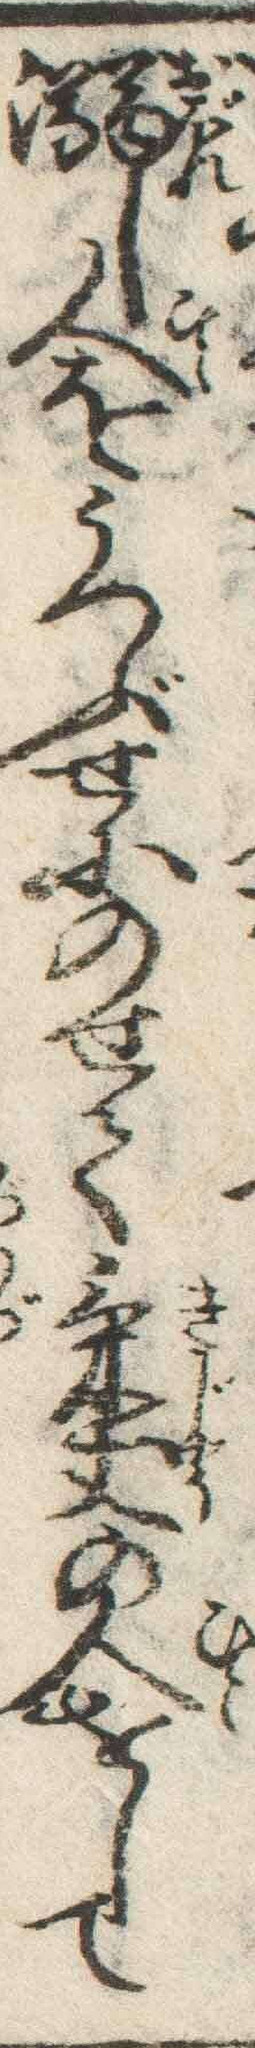溺し人をうつぶせにのせて気丈の人をして
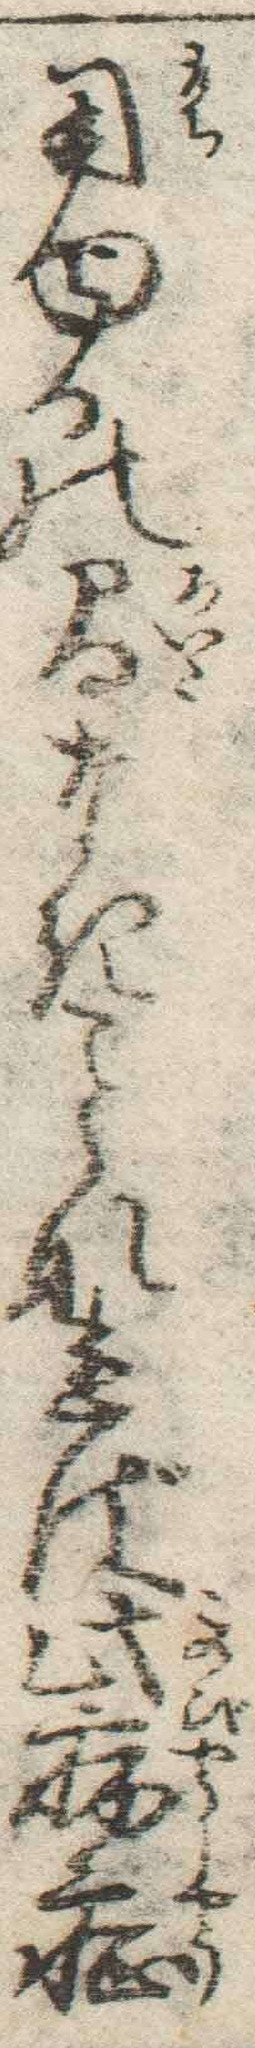用ゆるの間なきことなれば此病症
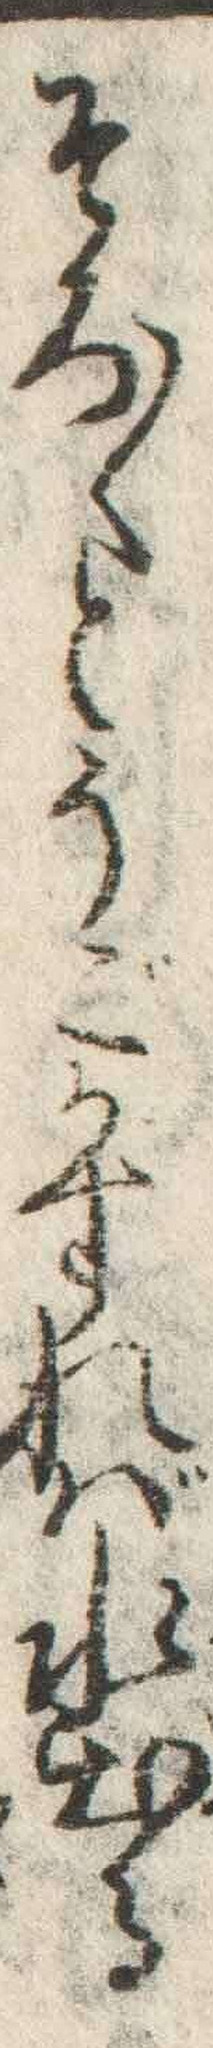そろ〳〵とうごかすれば水出る
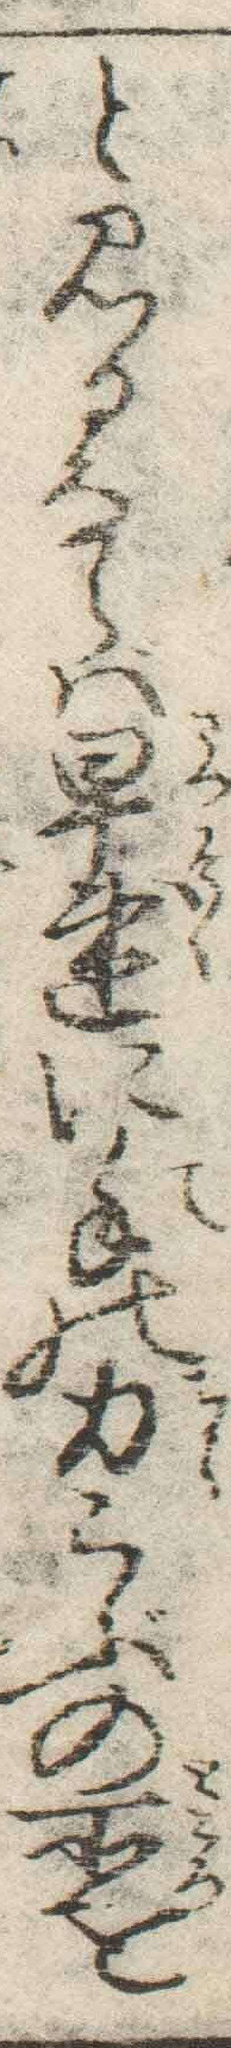と見るならば早速に手の力こぶの所を
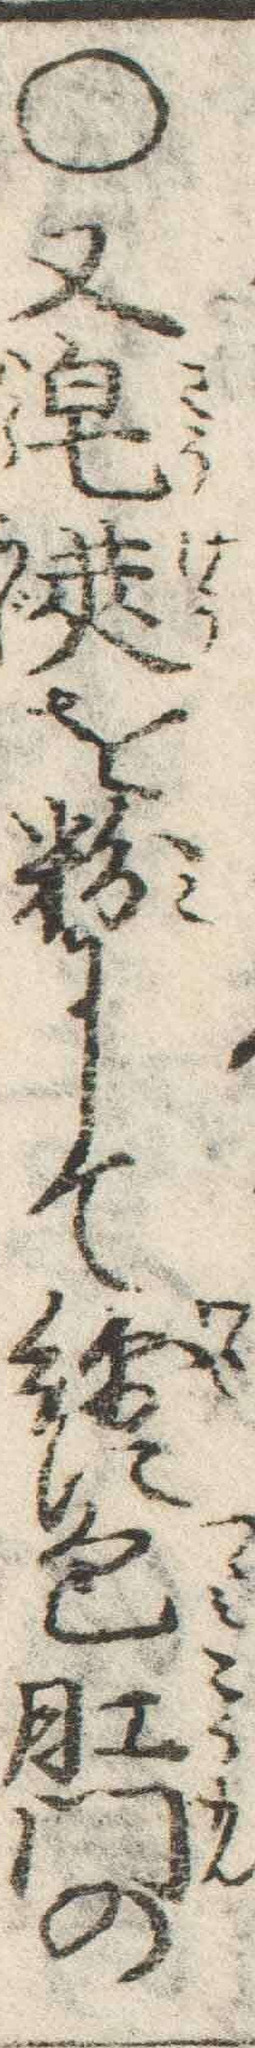○又皀莢を粉にして綿に包肛門の
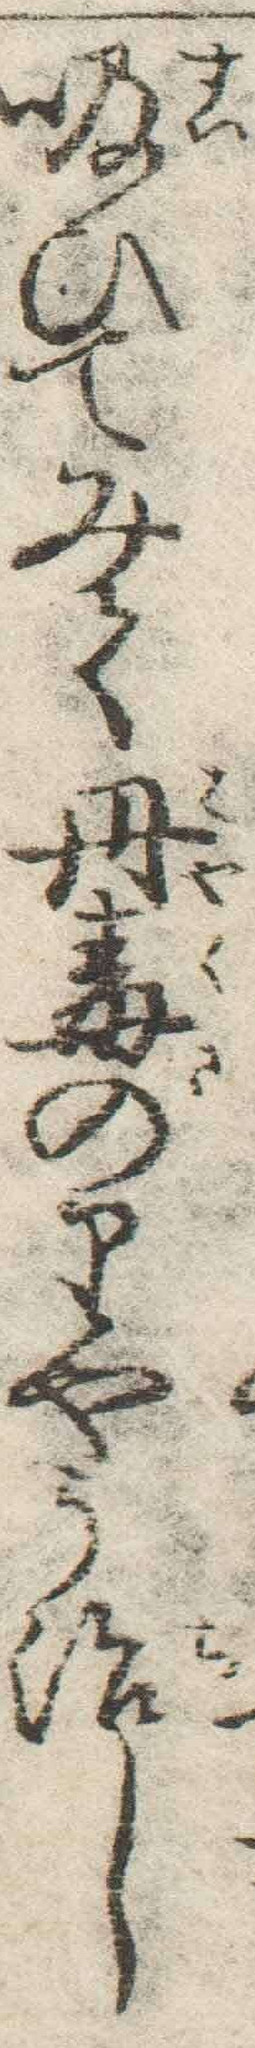吸ひてみて丹毒のりやう治し
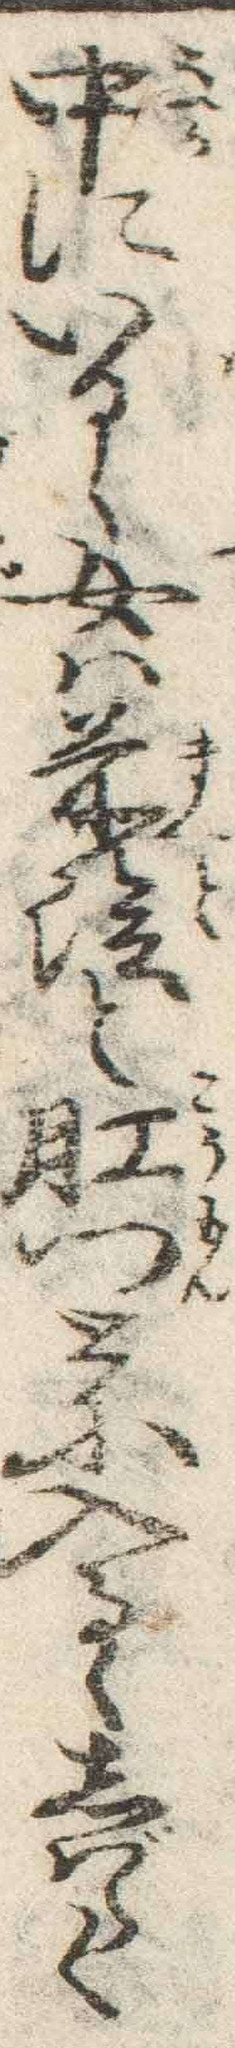中にいるゝ女は前陰と肛門とに入るゝしばらく
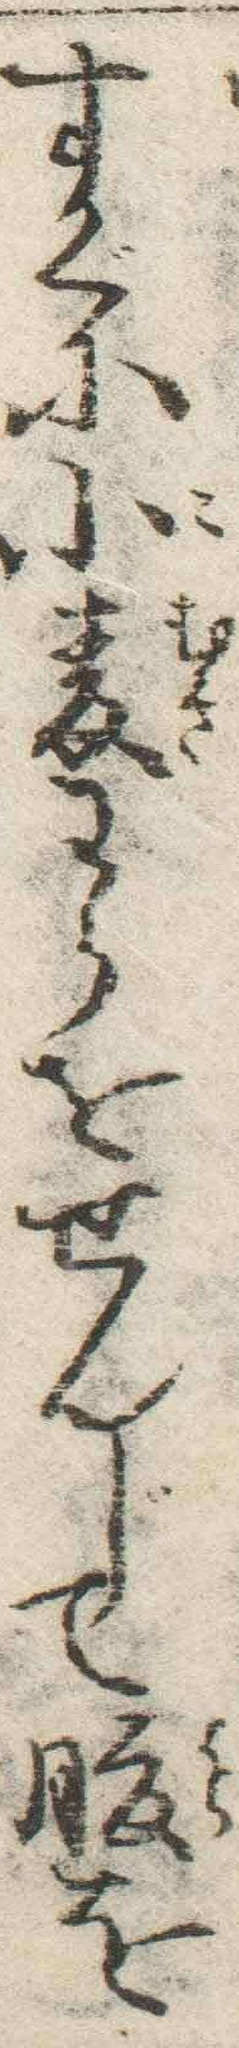すぐに小麦わらをせんじて腹を
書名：撫育草
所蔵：東京学芸大学附属図書館 国文学研究資料館
